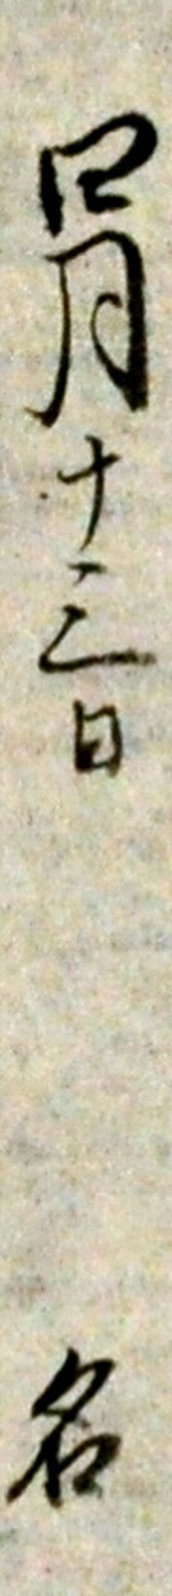四月十三日名
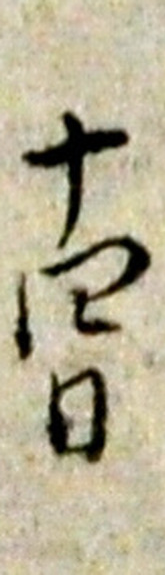十四日
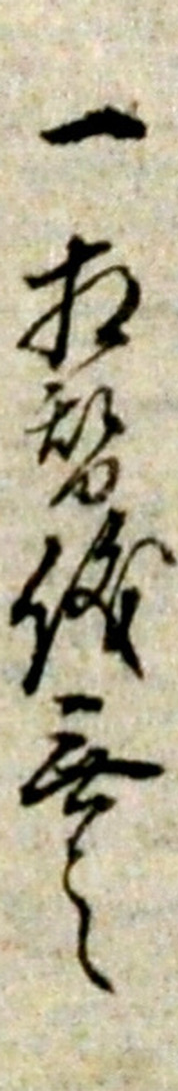一相替儀無之
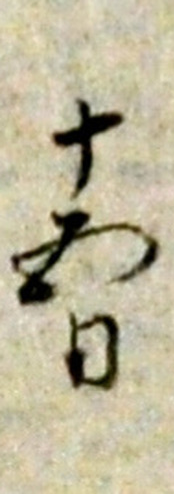十五日
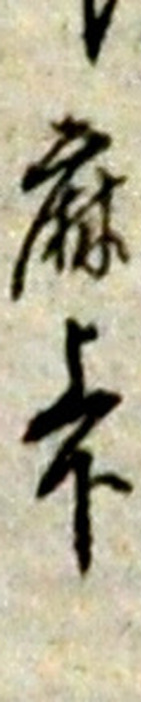麻上下
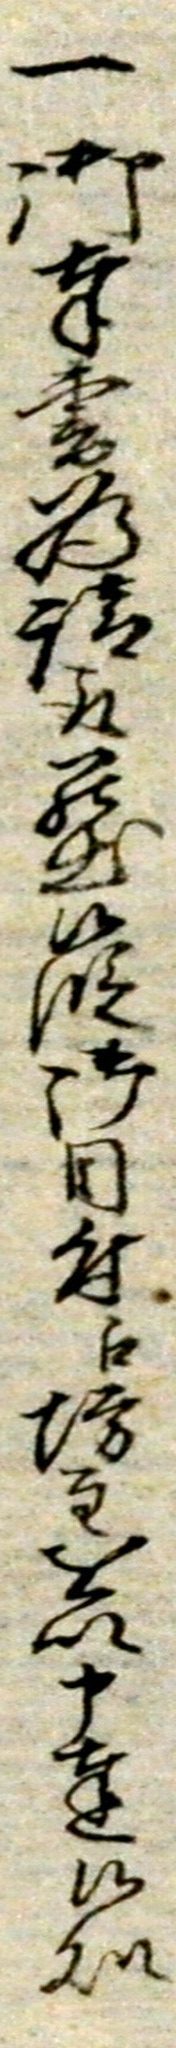一御奉書為請取罷出候段御目付江坊主を以申達候処
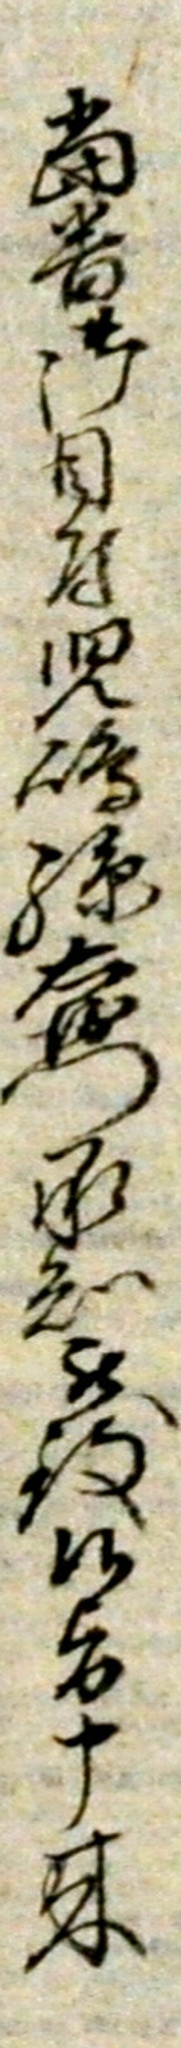当番御目付児嶋孫右衛門承知被致候旨申来
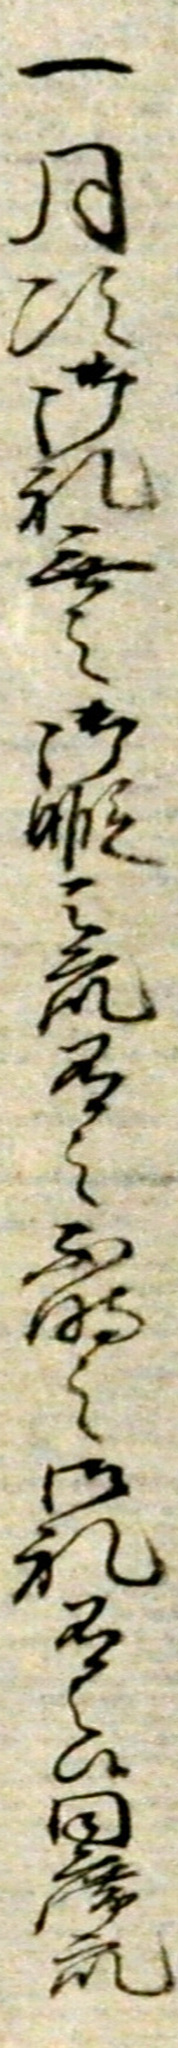一月次御礼無之御暇之衆多之不時之御礼有之候同席衆
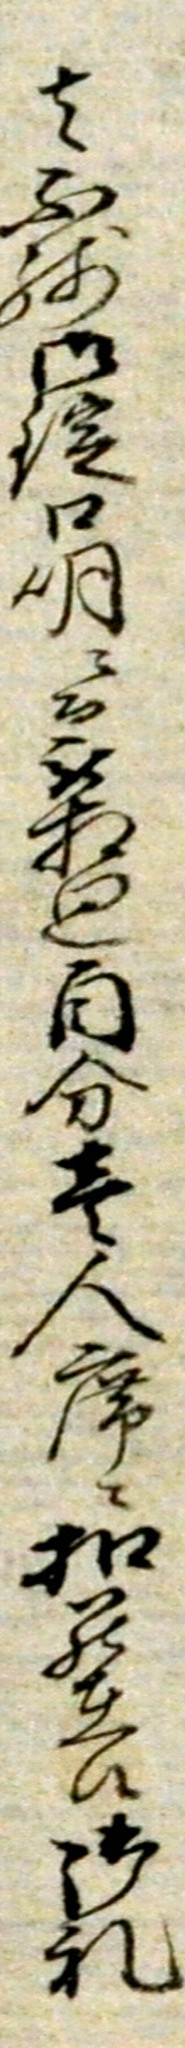者不残御錠口明ニ而被相廻自分一人席ニ扣罷在候御礼
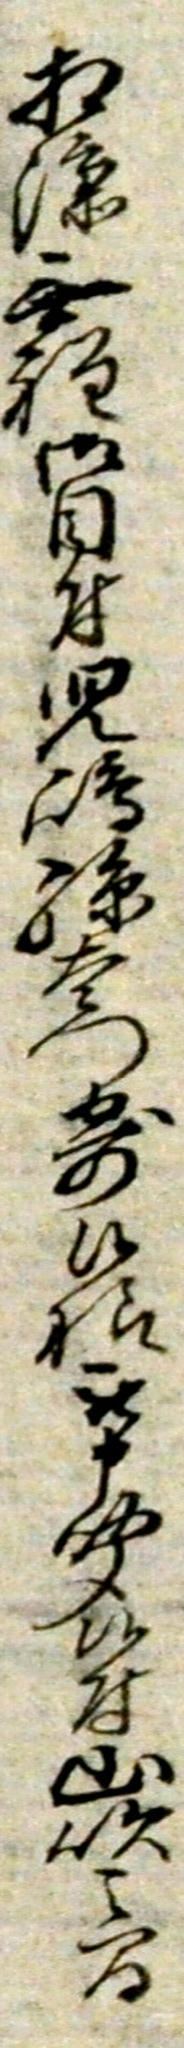相済無程御目付児嶋孫右衛門寄候様被申聞候付山吹之間
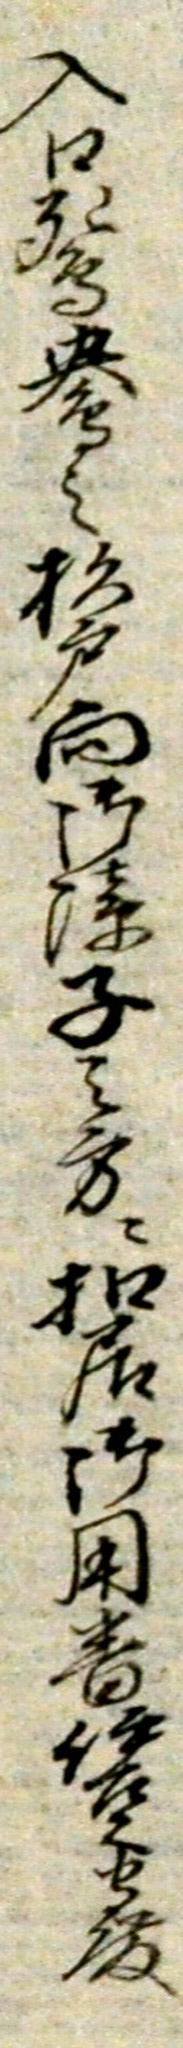入口鴛鴦之杉戸向御障子之方ニ扣居御用番伊豆守殿
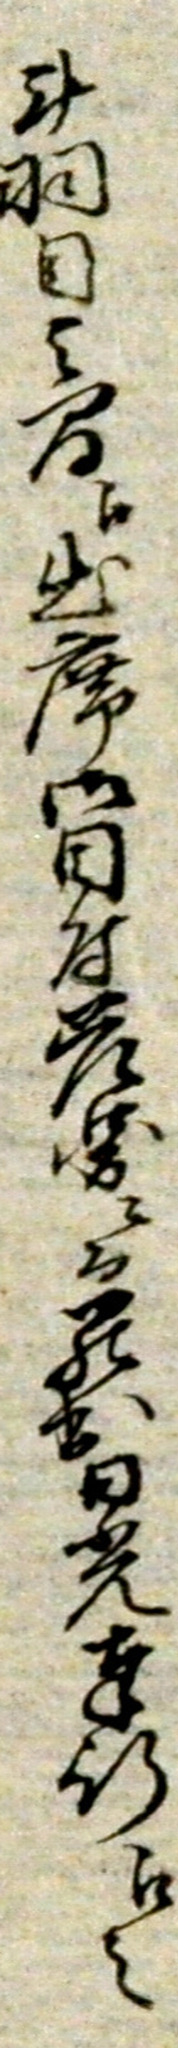計羽目之間江出席御目付差図ニ而罷出日光奉行江之奉書
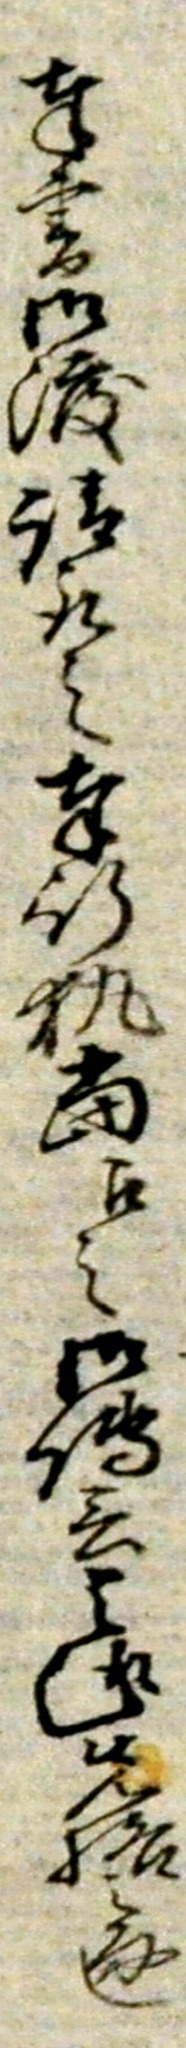御渡請取之奉行執當江之御伝言之趣先格之通

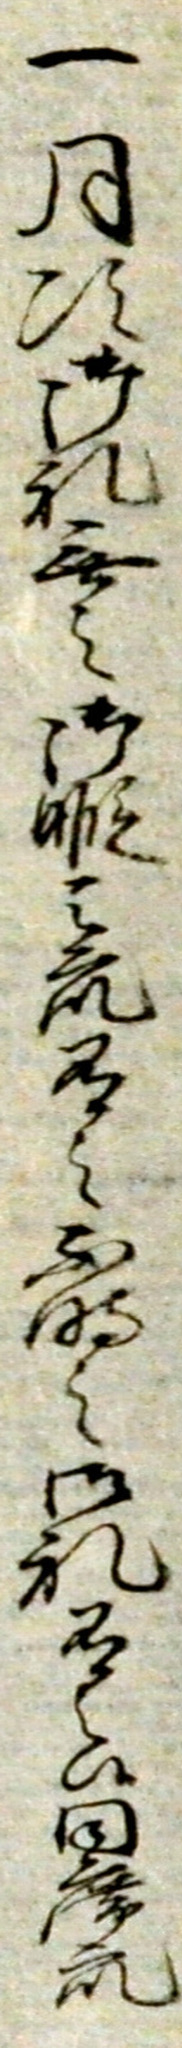一月次御礼無之御暇之衆有之不時之御礼有之候同席衆
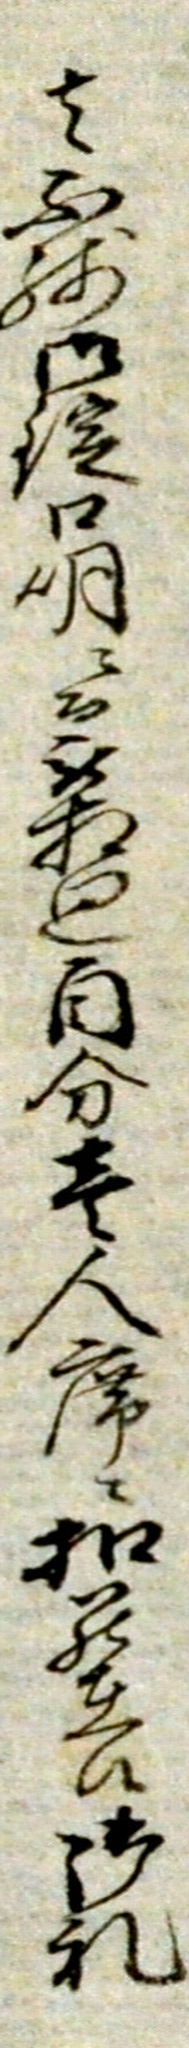者不残御錠口明ニ而被相廻自分壱人席ニ扣罷在候御礼
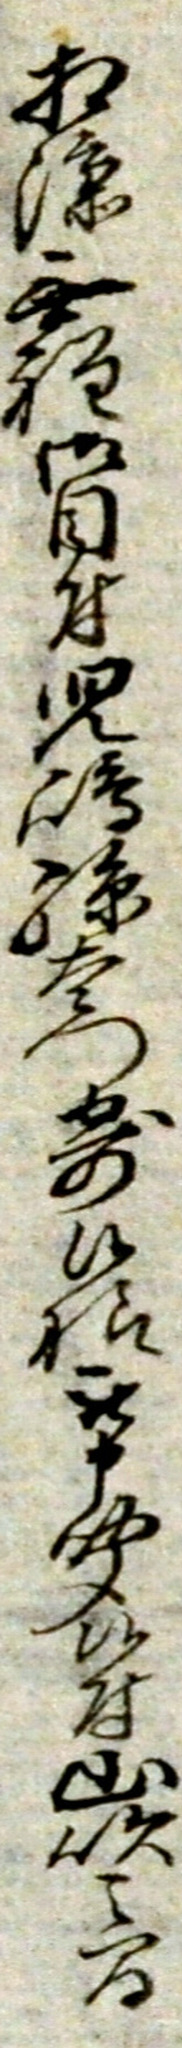相済無程御目付児嶋孫右衛門寄候様被申聞候付山吹之間
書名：日光御名代相勤候節ノ留
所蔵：伊那市立高遠町図書館・合同会社AMANE
